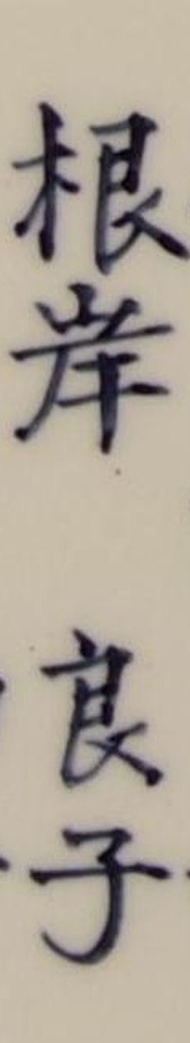根岸良子
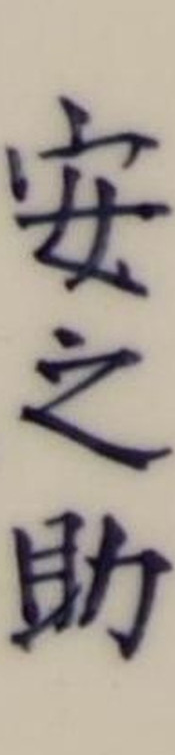安之助
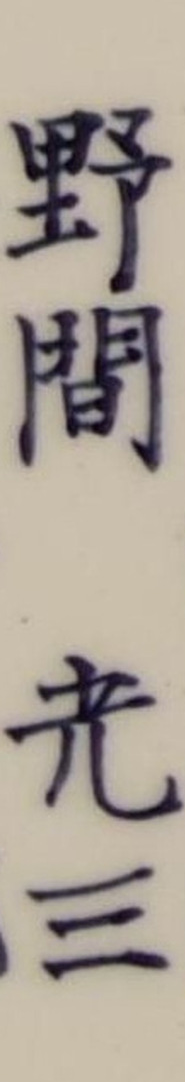野間光三
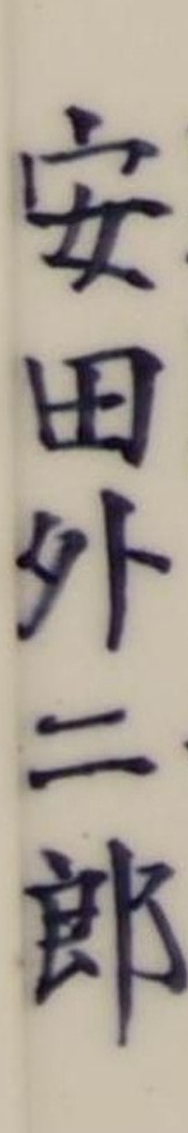安田外二郎

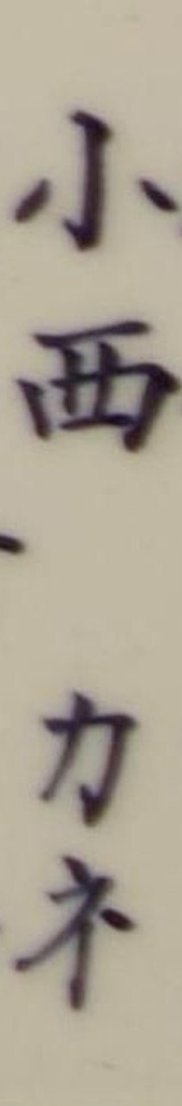小西カネ
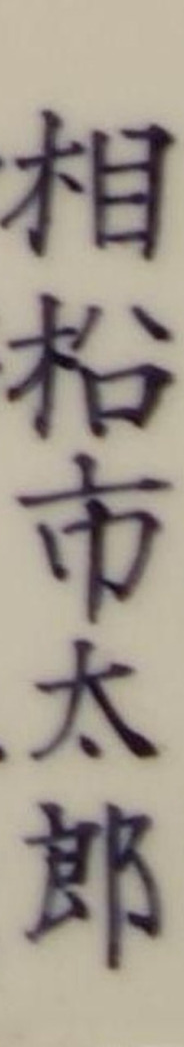相松市太郎
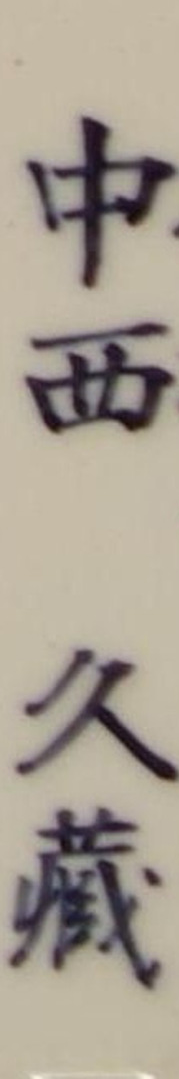中西久蔵
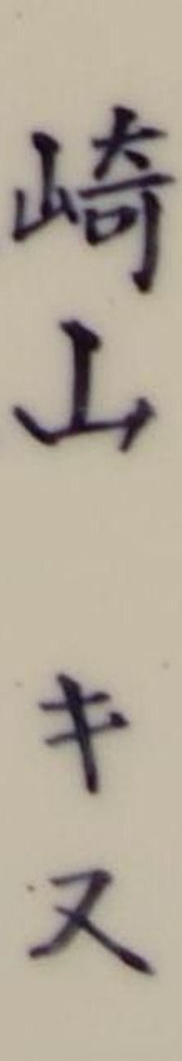崎山キヌ
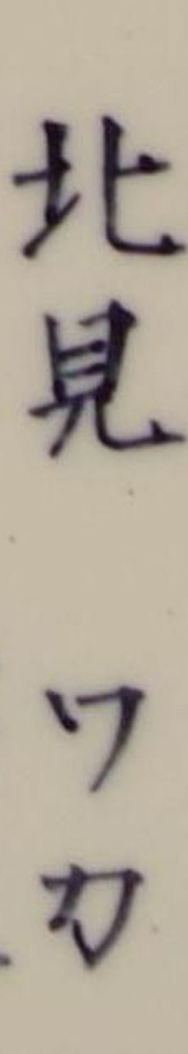北見ワカ
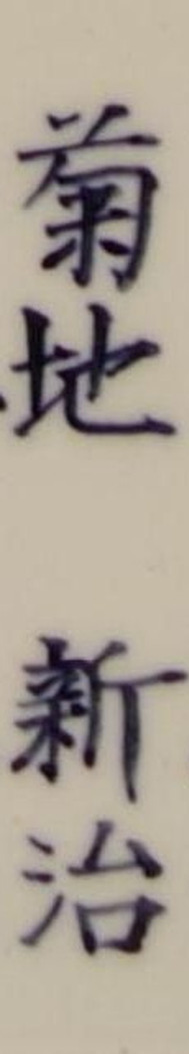菊地新治
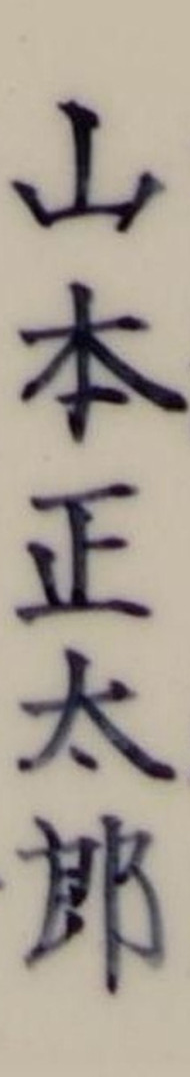山本正太郎
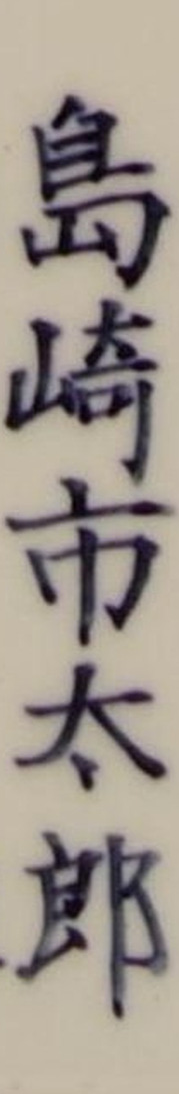島崎市太郎
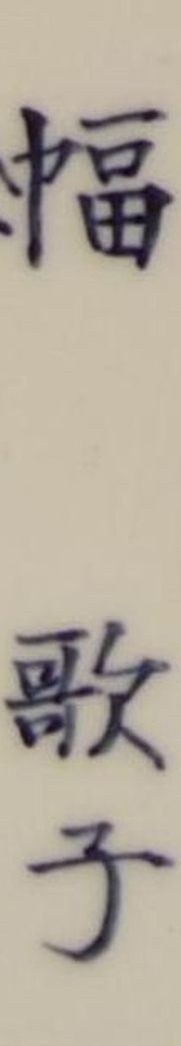幅歌子
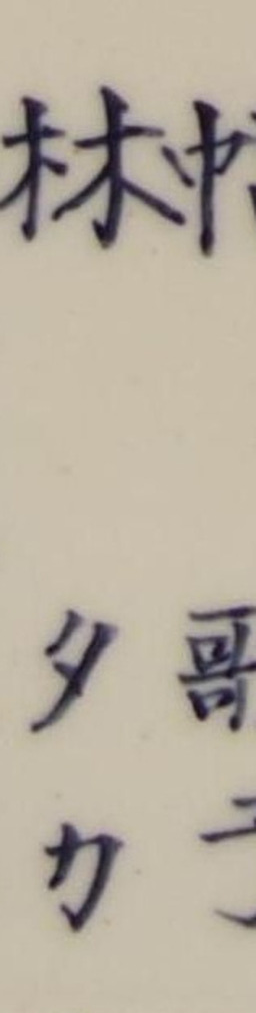林タカ
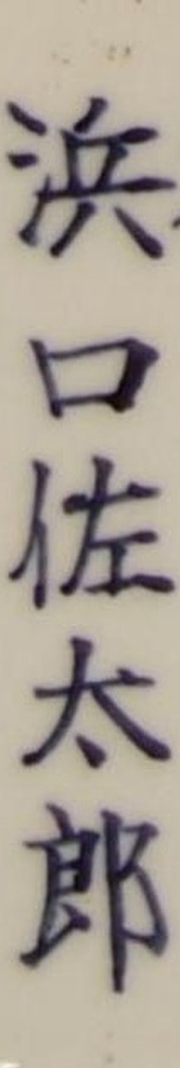浜口佐太郎
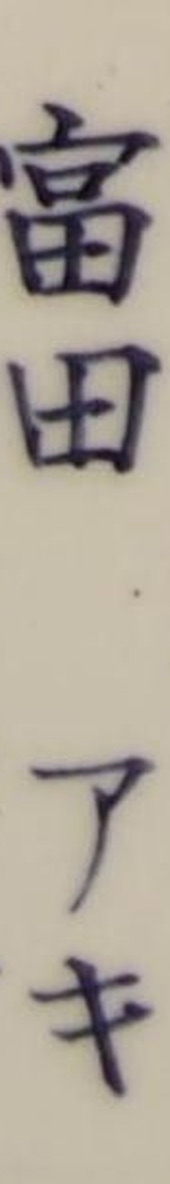富田アキ
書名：M~S
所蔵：高野山金剛峯寺
